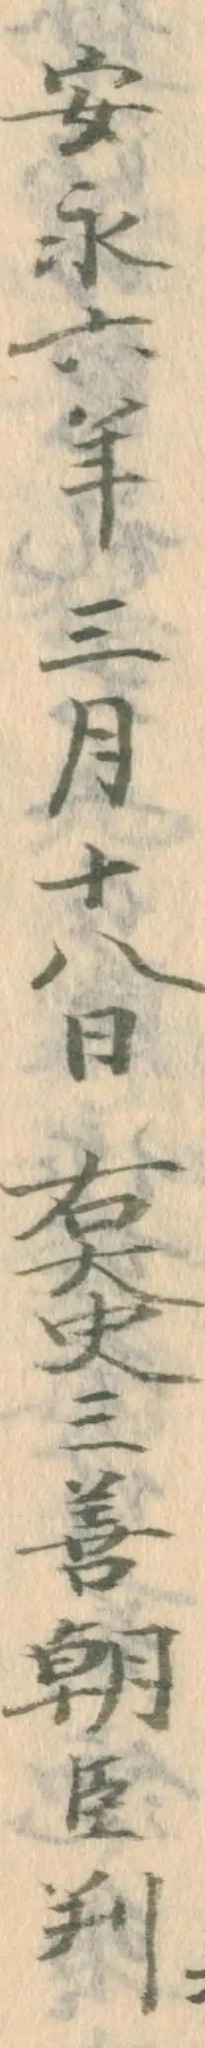安永六年三月十八日右大史三善朝臣判奉
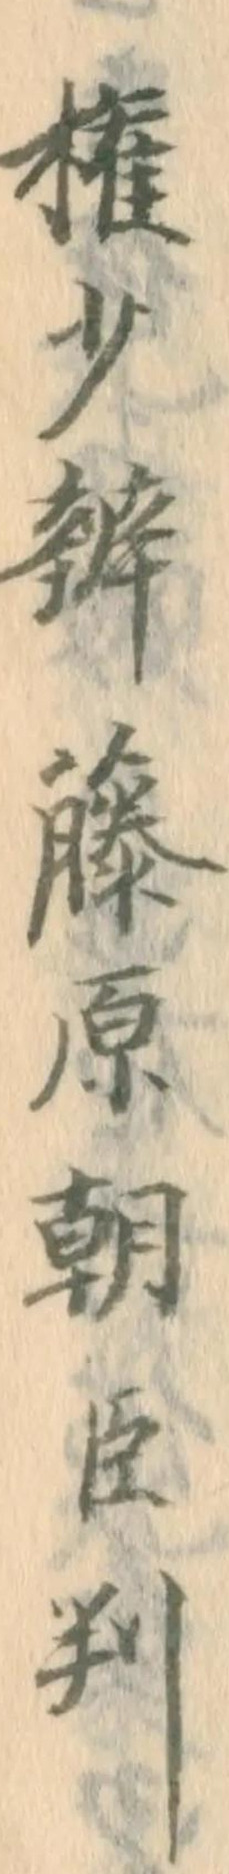権少弁藤原朝臣判

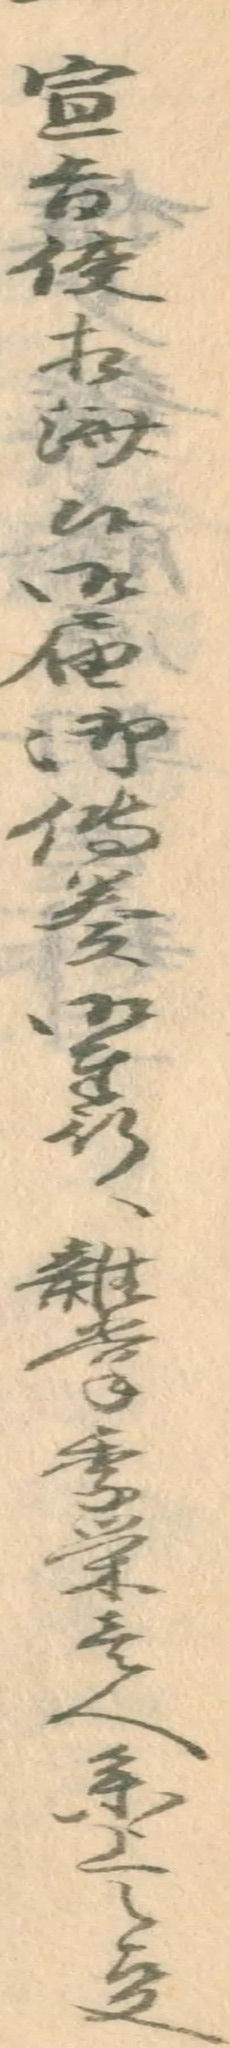一宣旨使相済候御届御伝奏御奉行へ雑掌季栄壱人参上之事
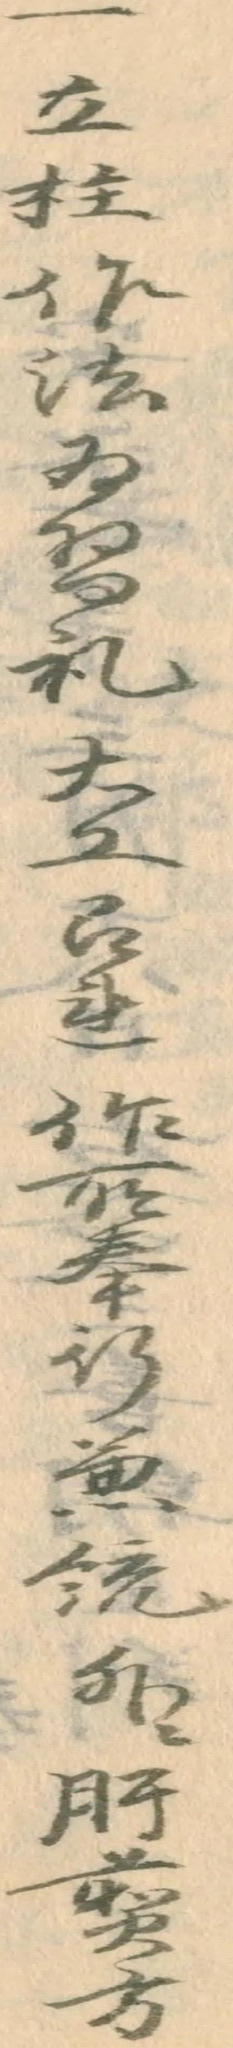一立柱作法為習礼大工召連作所奉行兼統外ニ肝煎方
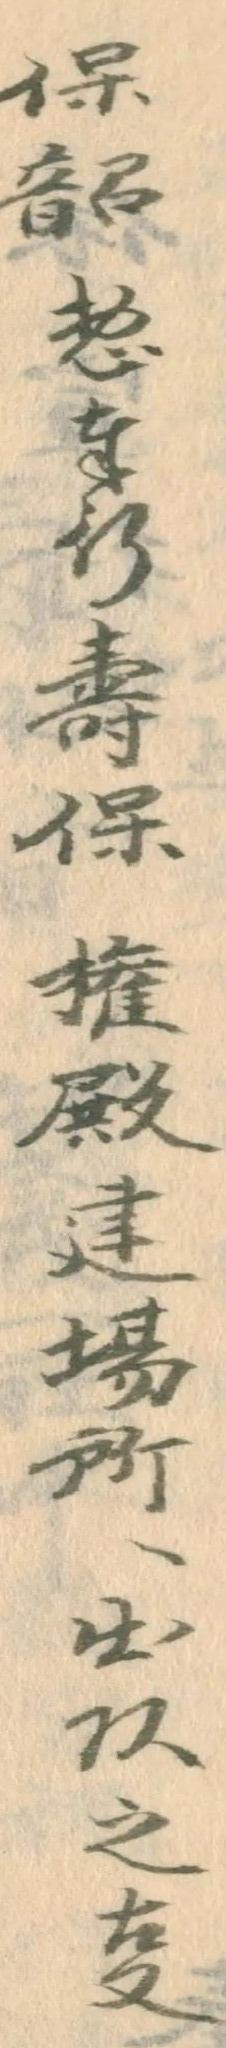保韶惣奉行寿保権殿建場所へ出頭之事
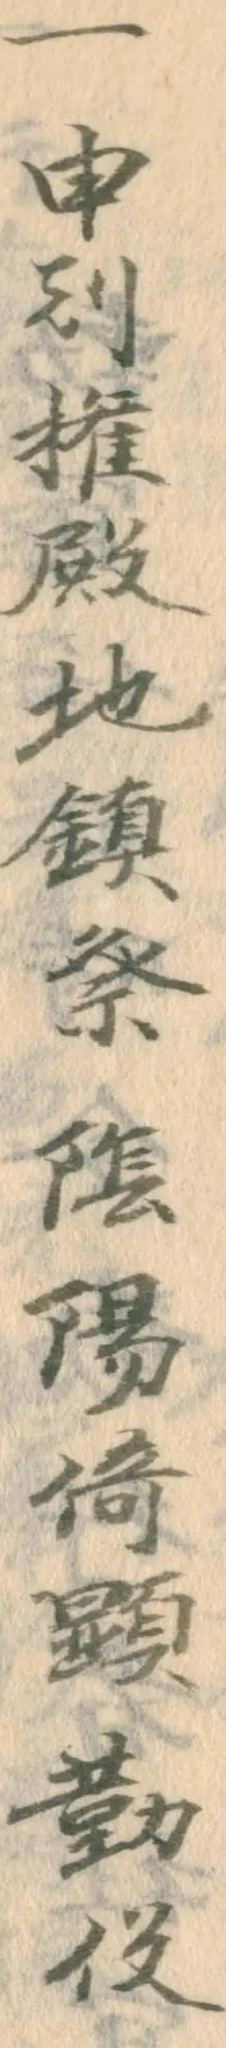一申刻権殿地鎮祭陰陽倚顕勤役
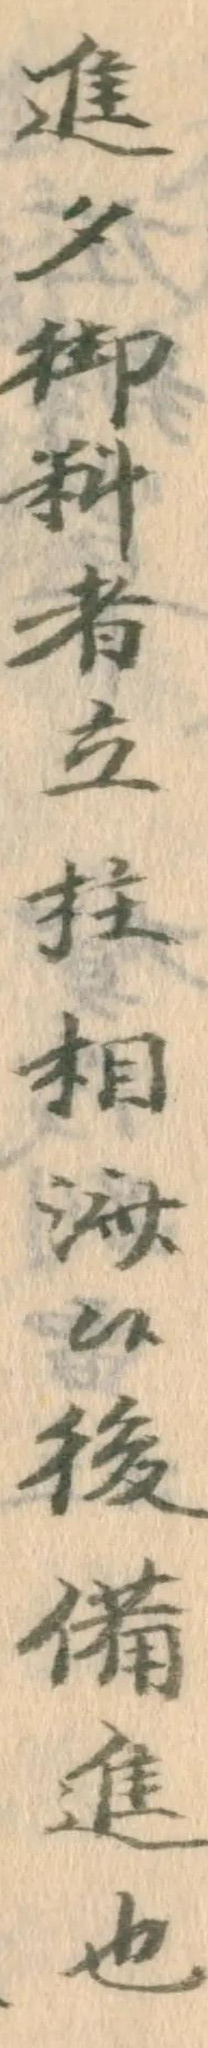進夕御料者立柱相済候後備進也
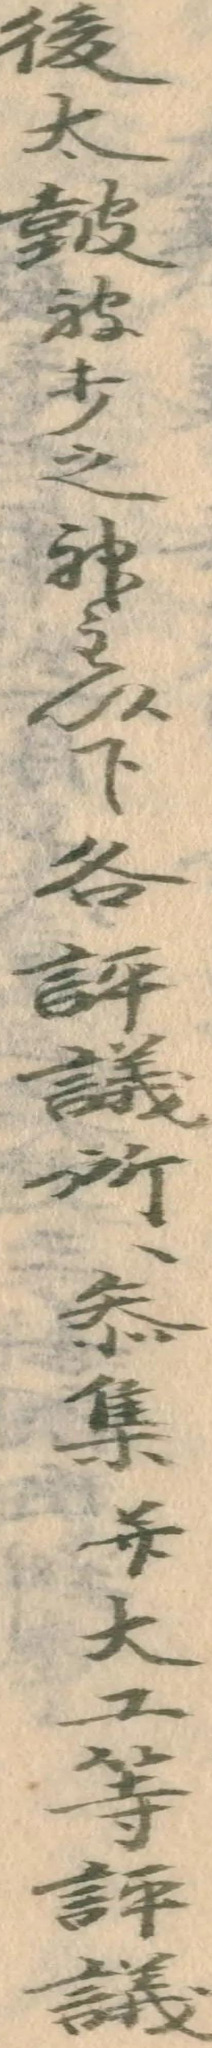後太皷被打之神主以下各評議所へ参集并大工等評議
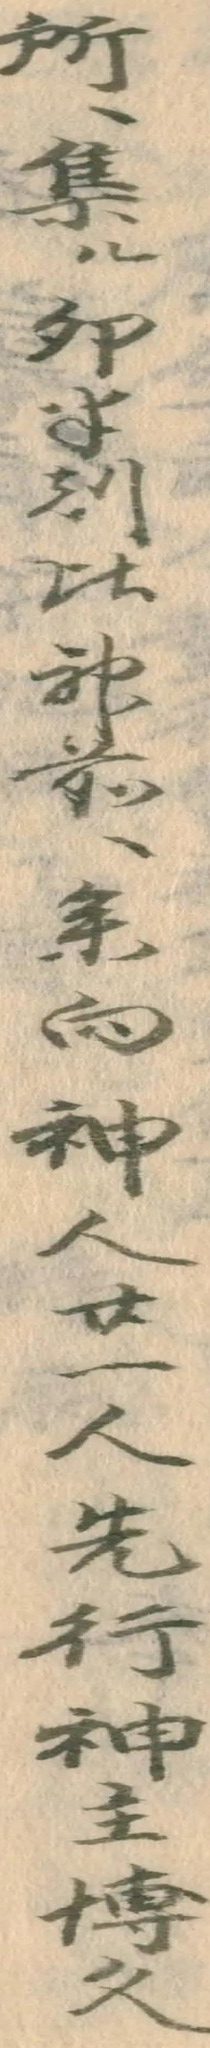所へ集ル卯半刻比神前へ参向神人廿一人先行神主博久
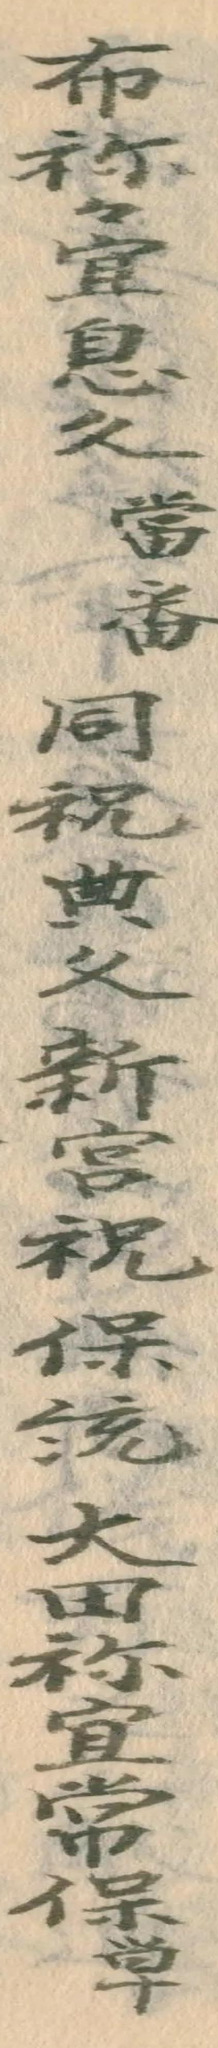布祢々宜息久当番同祝典久新宮祝保統大田祢宜常保単
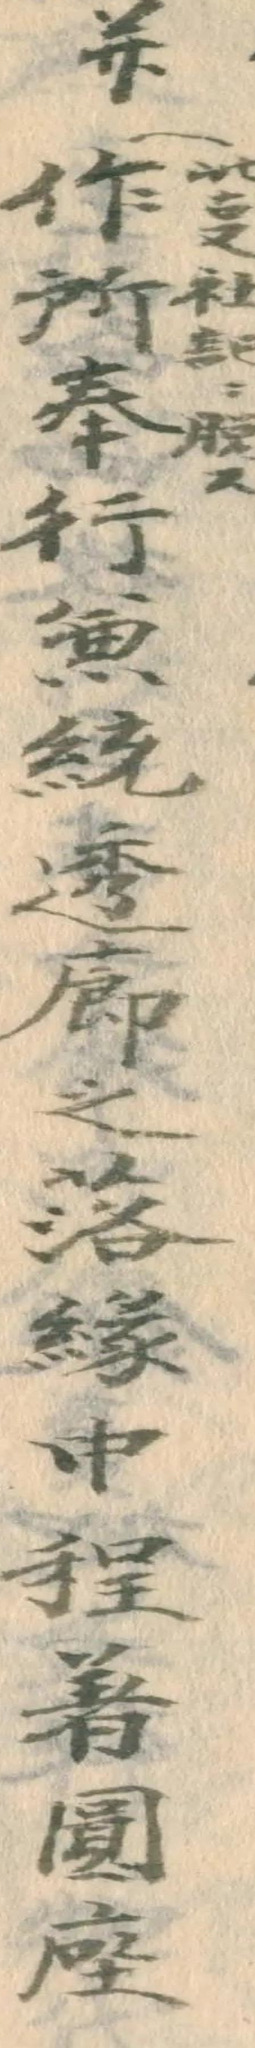并作所奉行兼統遷廊之落縁中程着円座
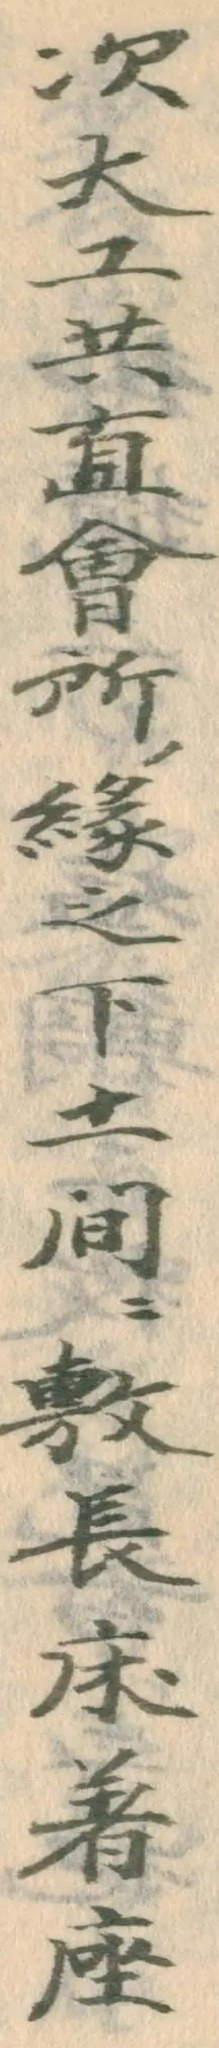次大工共直会所ノ縁之下土間ニ敷長床着座
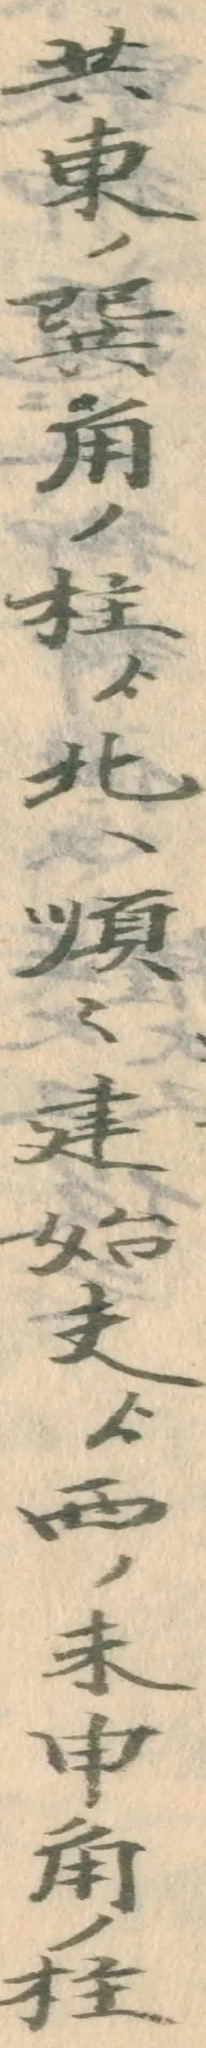共東ノ巽角ノ柱ゟ北へ順々建始夫ゟ西ノ未申角ノ桂
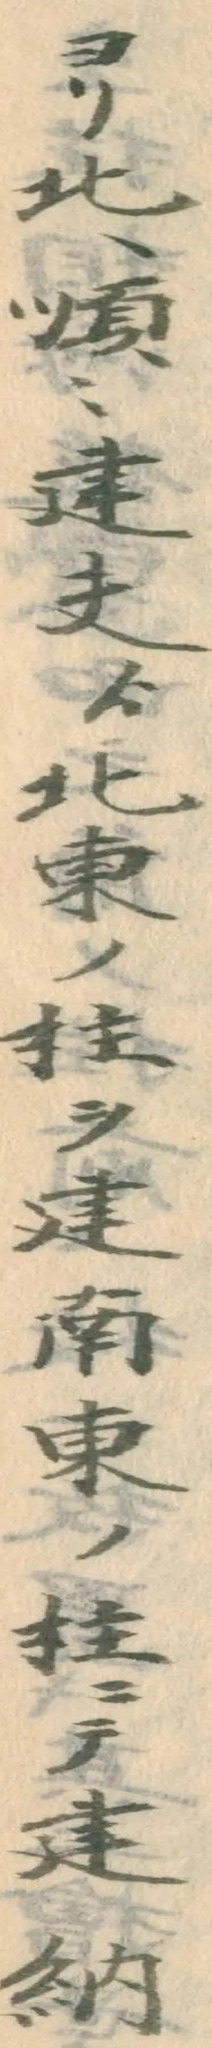ヨリ北ヘ順々建夫ゟ北東ノ柱ヲ建南東ノ桂ニテ建納

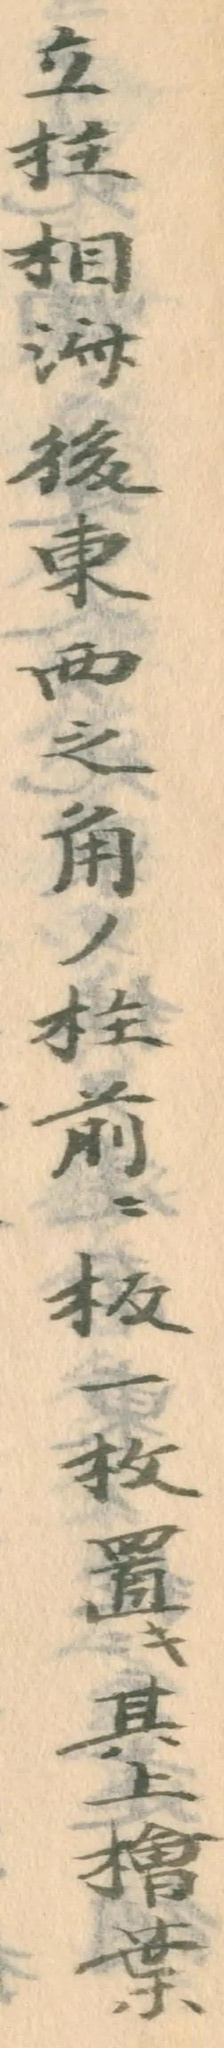立柱相済後東西之角ノ柱前ニ板一枚置キ其上檜葉
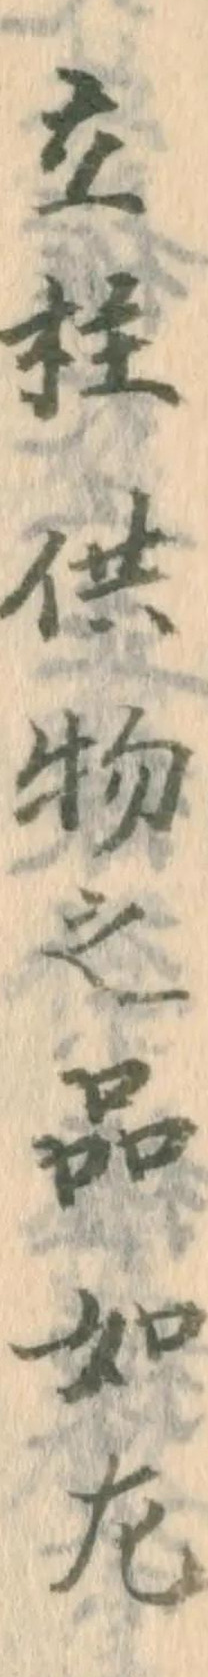立柱供物之品如左
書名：賀茂社記録. 第17冊
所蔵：国立国会図書館 National Diet Library, JAPAN
